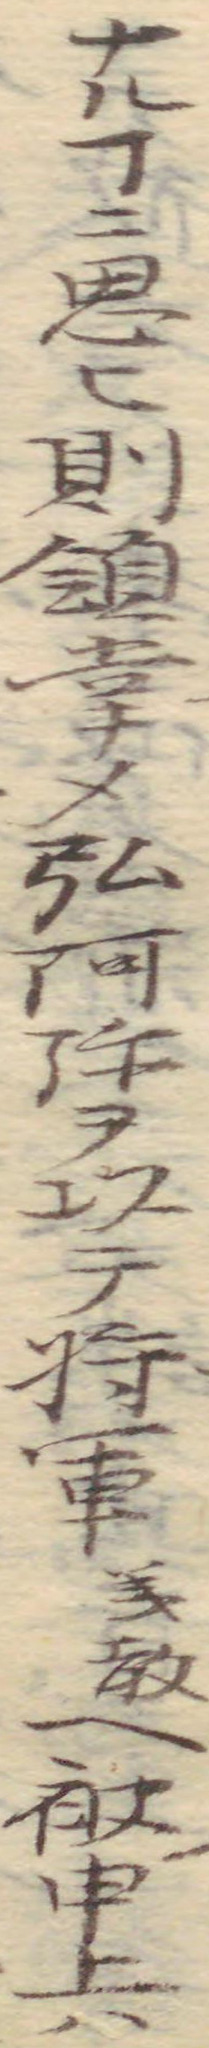ナルコトニ思ヒ則領掌シテ弘阿弥ヲ以テ将軍義教ヘ被申上ハ
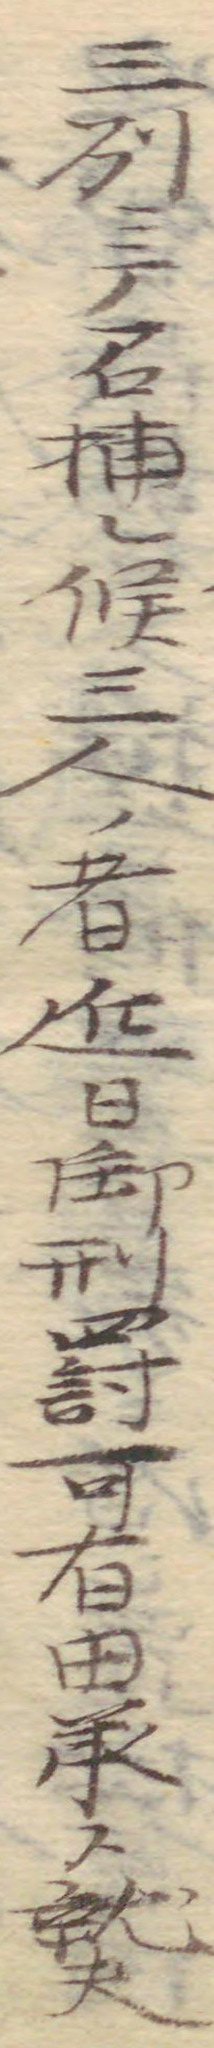三州ニテ召捕レ候三人ノ者近日御刑罰可有由承ス就夫
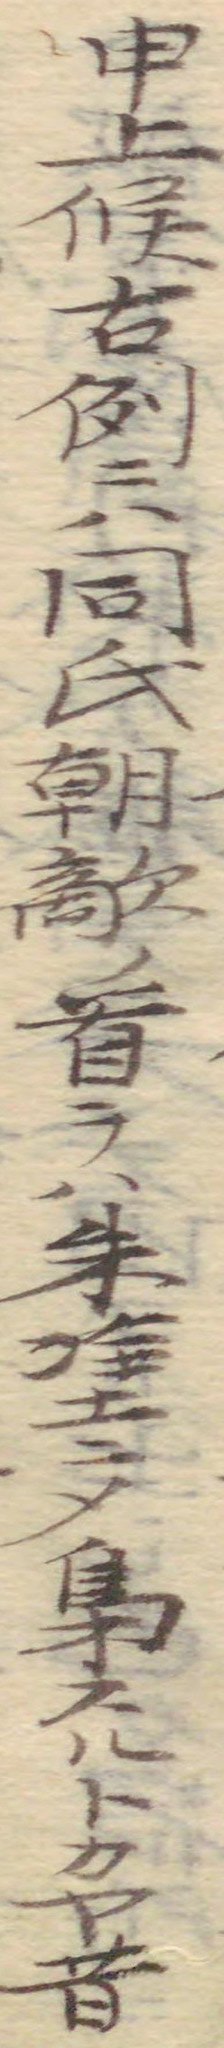申上候古例ニハ同氏朝敵ノ首ヲハ朱塗ニシテ梟スルトカヤ昔
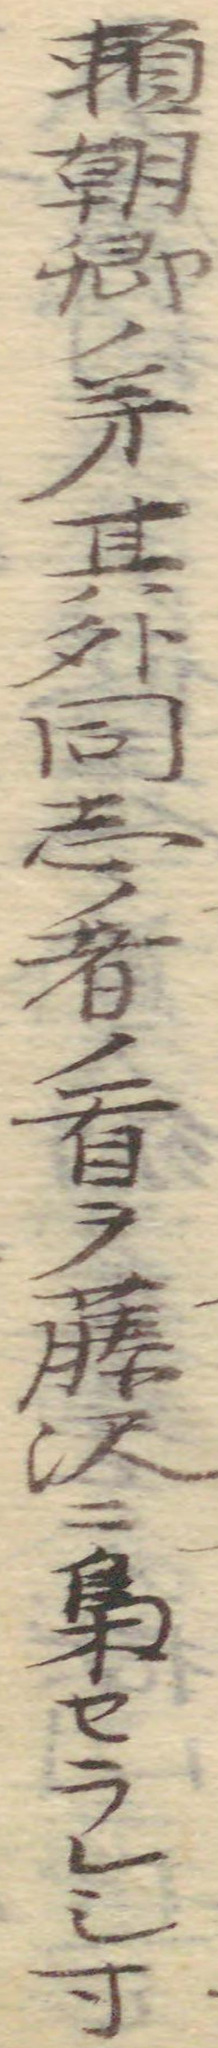頼朝卿ノ弟其外同志ノ者ノ首ヲ藤沢ニ梟セラレシ寸
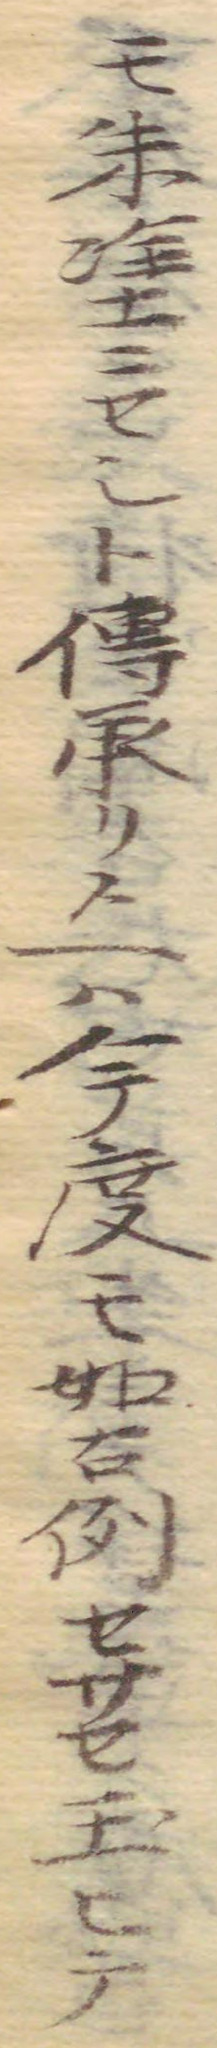モ朱塗ニセント伝承リ候ヘハ今度モ如右例セサセ玉ヒテ

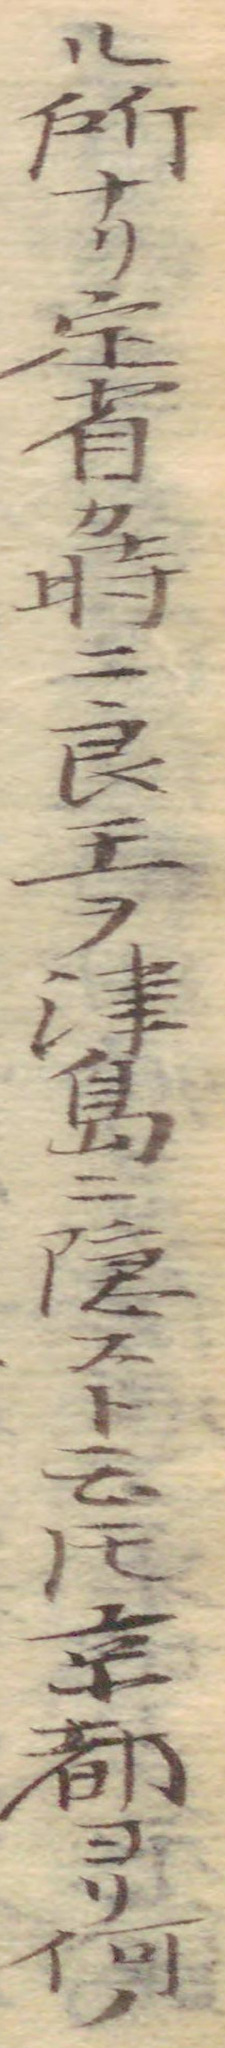ル所ナリ定省カ時ニ良王ヲ津島ニ隠スト云トモ京都ヨリ何ノ
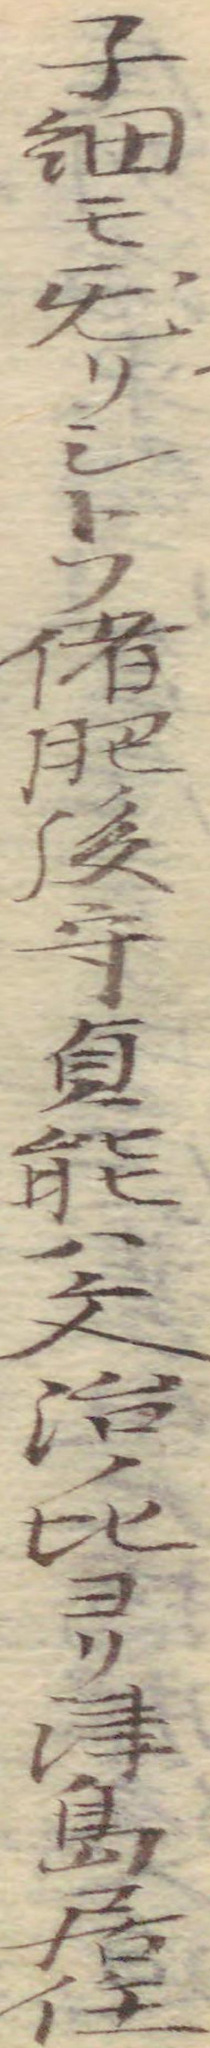子細モ無リシトソ偖肥後守貞能ハ文治ノ頃ヨリ津島居住
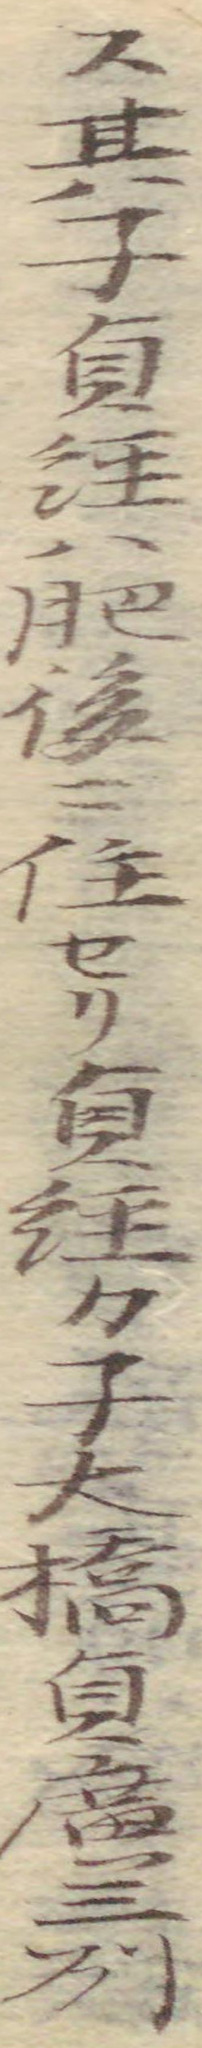ス其子貞経ハ肥後ニ住セリ貞経カ子大橋貞広三州
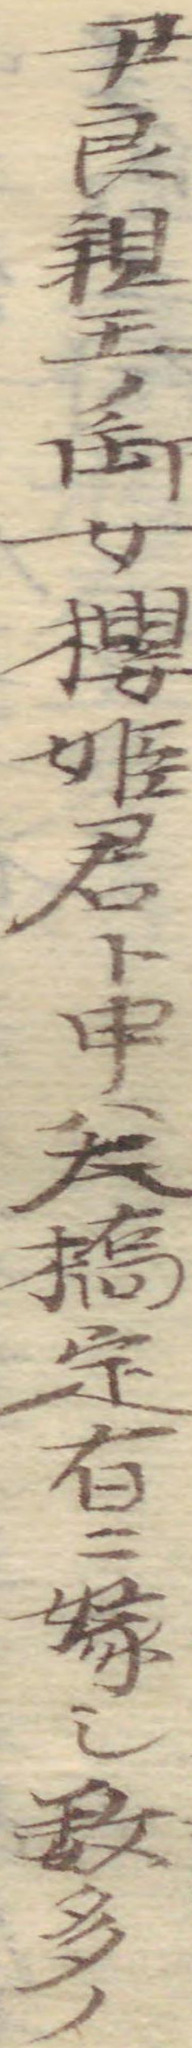尹良親王ノ御女桜姫君ト申ハ大橋定有ニ嫁シ数多ニ
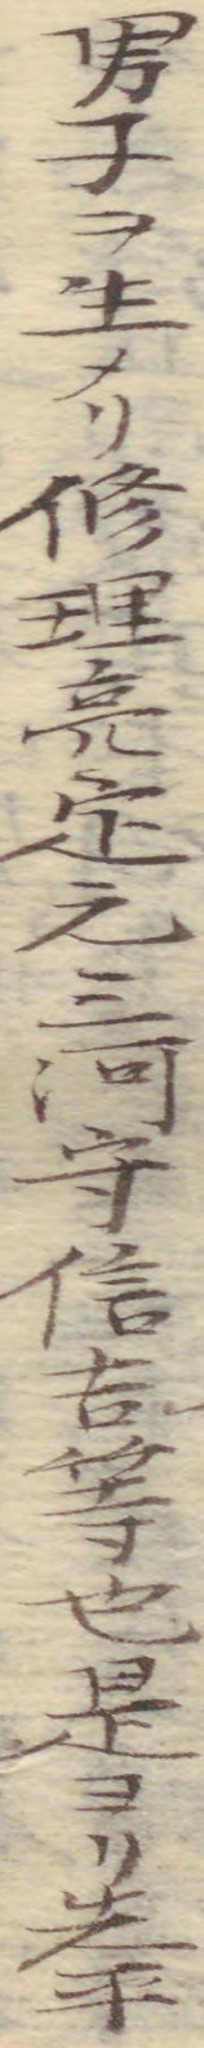男子ヲ生メリ修理亮定元三河守信吉等也是ヨリ先平
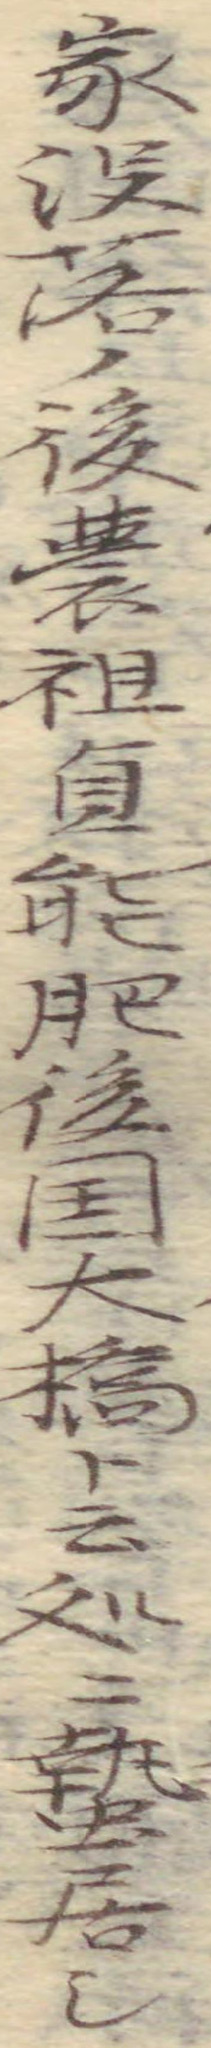家没落ノ後曩祖貞能肥後国大橋ト云処ニ蟄居シ
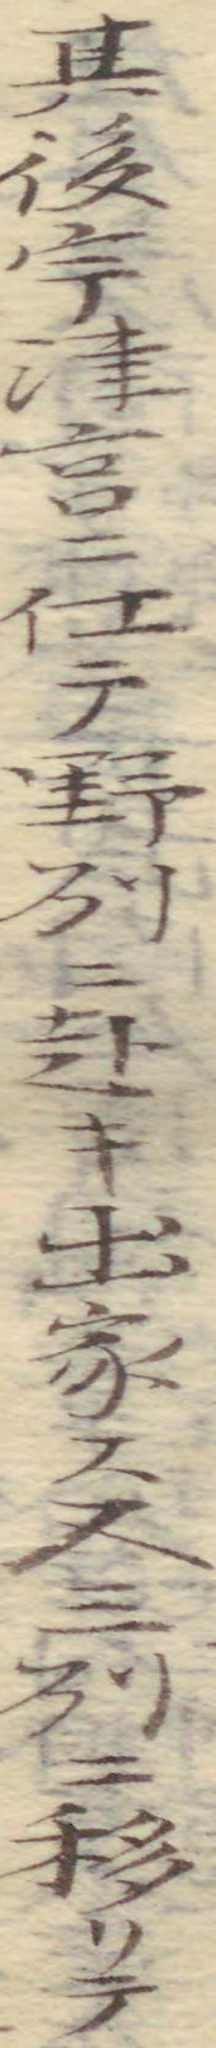其後宇津宮ニ仕テ野州ニ赴キ出家ス又三州ニ移リテ
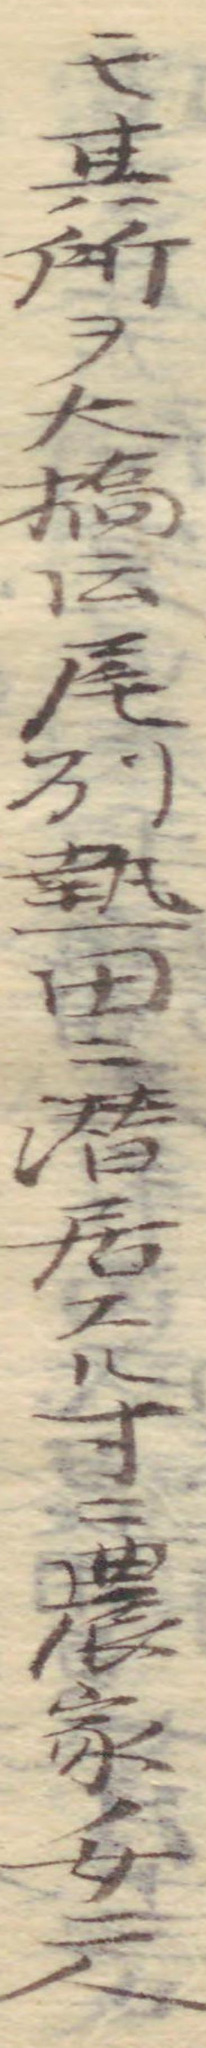モ其所ヲ大橋ト云尾州熱田ニ潜居スル寸ニ農家ノ女二人
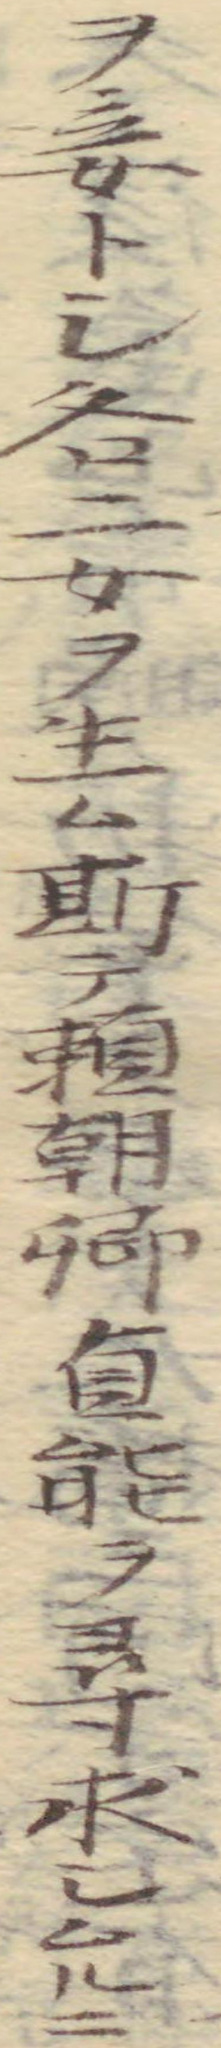ヲ妾トシ各二女ヲ生ム斯テ頼朝卿貞能ヲ尋求シムルニ
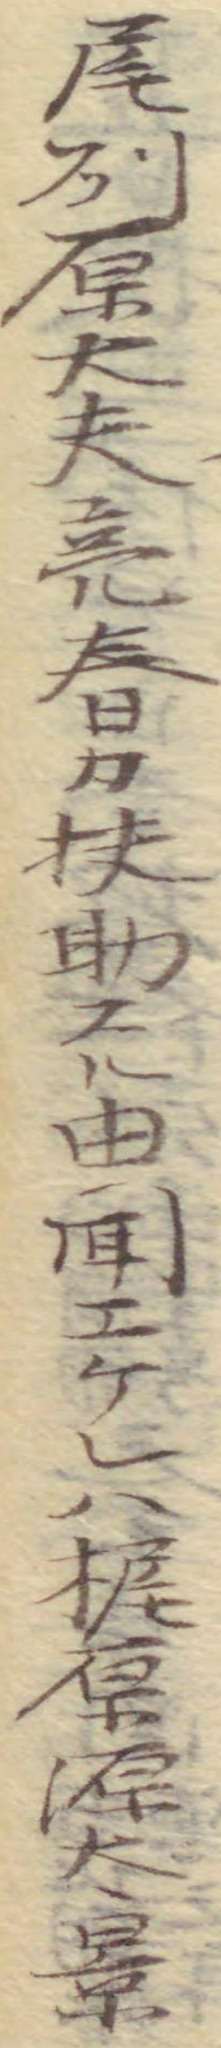尾州原大夫亮春カ扶助スル由聞エケレハ梶原源太景
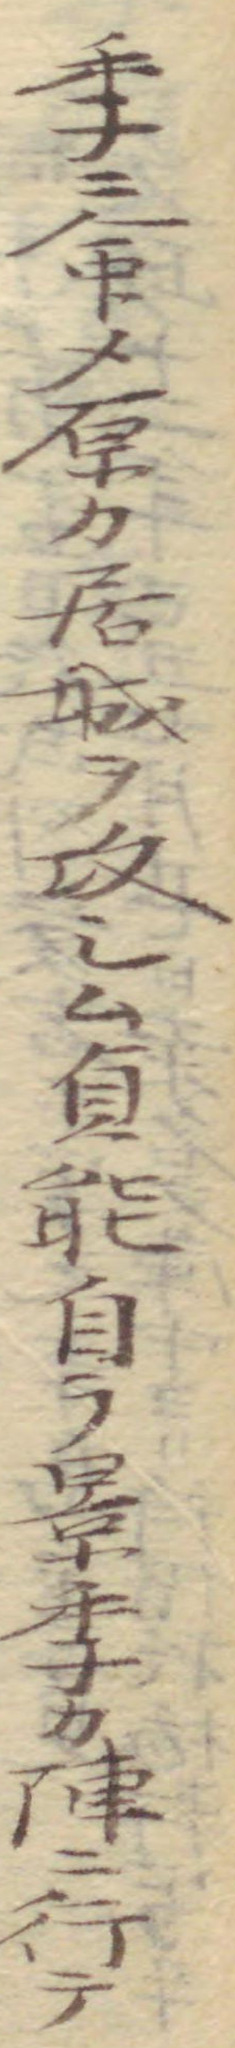季ニ命シテ原カ居城ヲ攻シム貞能自ラ景季カ陣ニ行テ
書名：鶯宿雑記. 巻199-200
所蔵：国立国会図書館 National Diet Library, JAPAN
